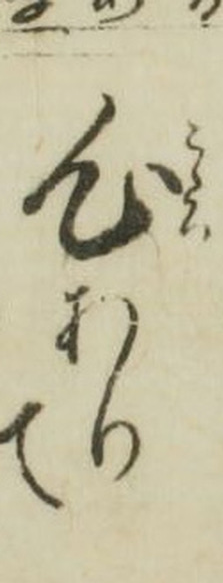心ありて
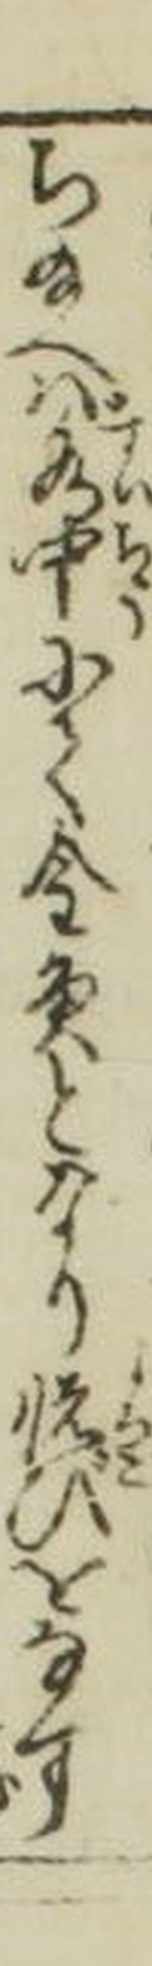ち給へば水中にて金魚となり悦びをなす
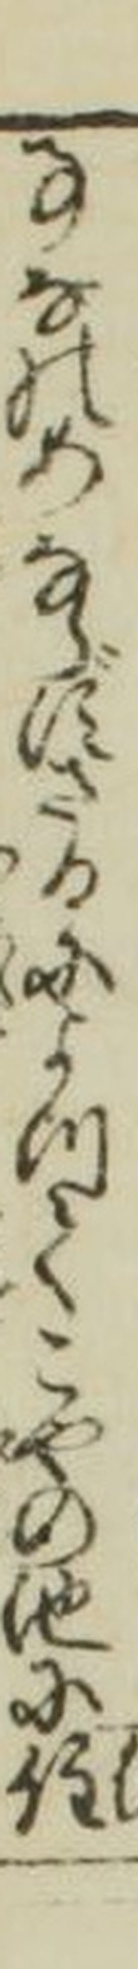事なのめならずさるによつてこやの池に住
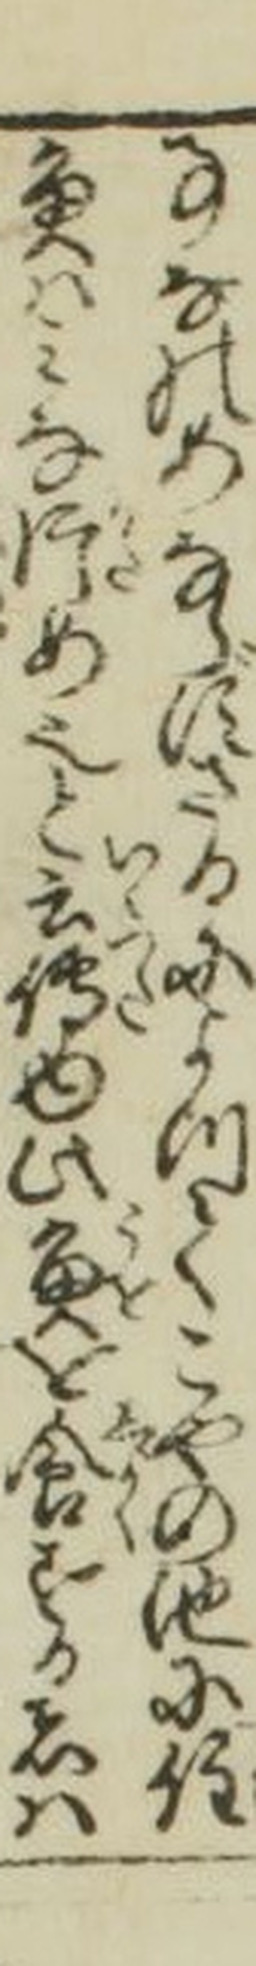魚はみな片め也と云伝ゆ此魚を食する者は
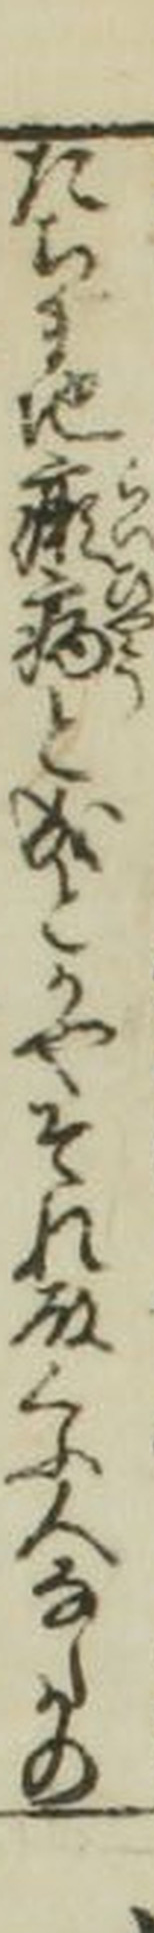たちまち癩病と成とかやそれ故くふ人なしかの
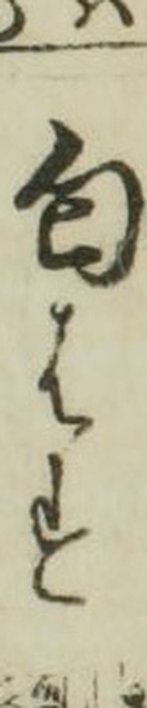匂はす
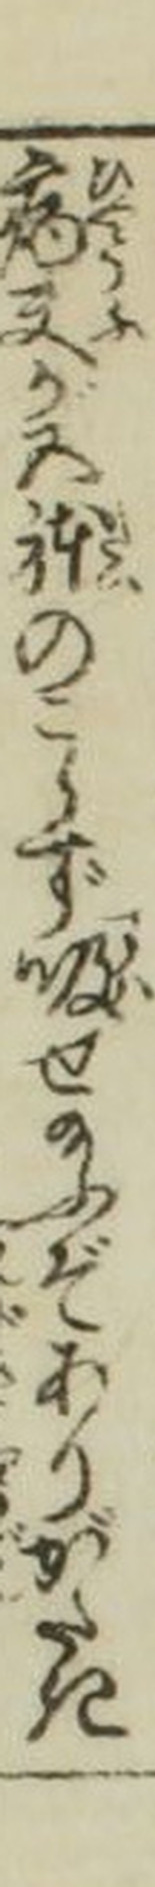病夫が五体のこらず吸せ給ふぞありがたき
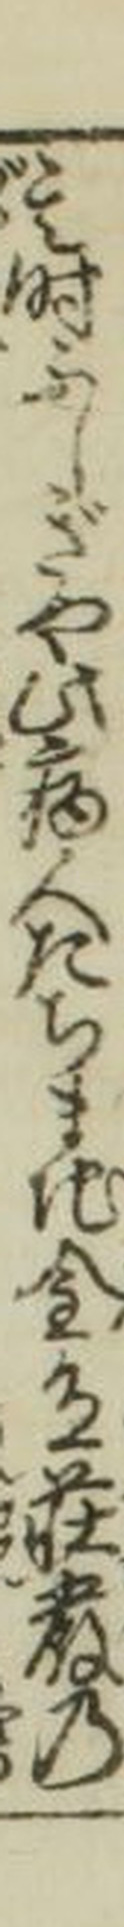其時ふしぎや此病人たちまち金色荘厳の
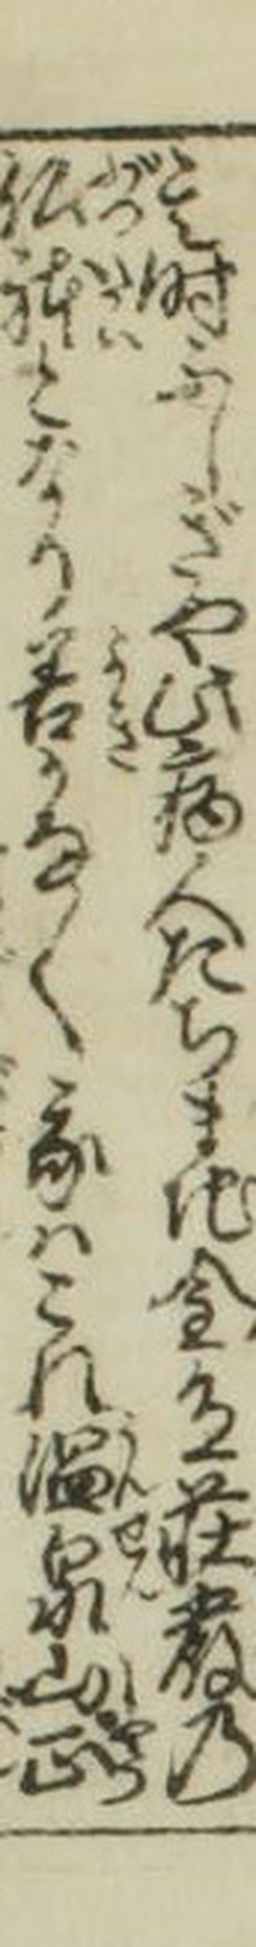仏体となり善かな〳〵我はこれ温泉山正
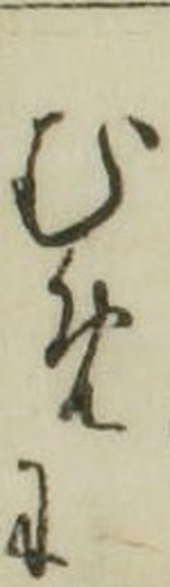むめに
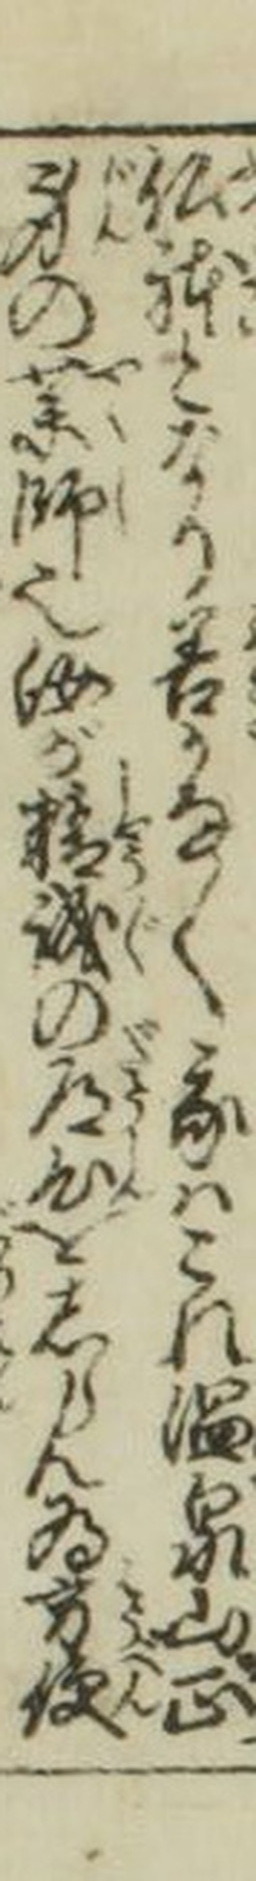身の薬師也汝が精誠の道心をしらん為方便
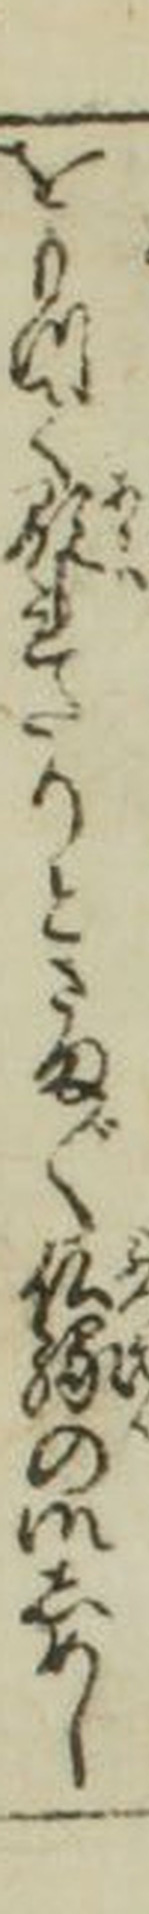をもつて顕れたりとさま〴〵仏縁の御しめし
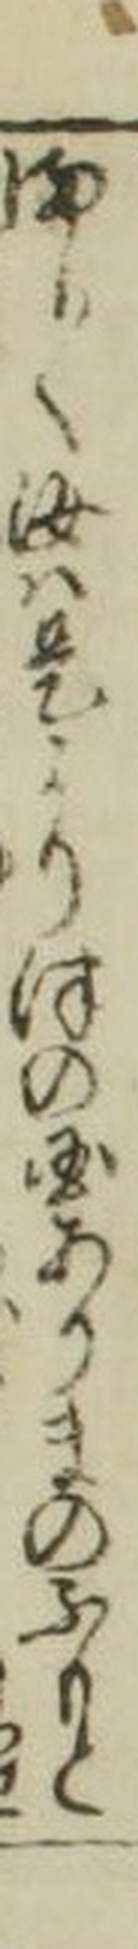まし〳〵汝は是よりつの国ありまのふもと
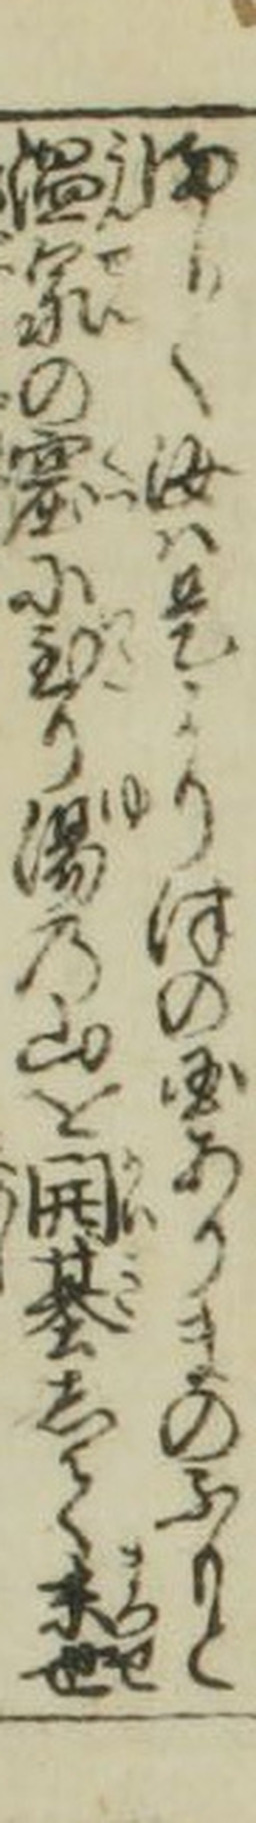温泉の窟に至り湯の山を開基して末世
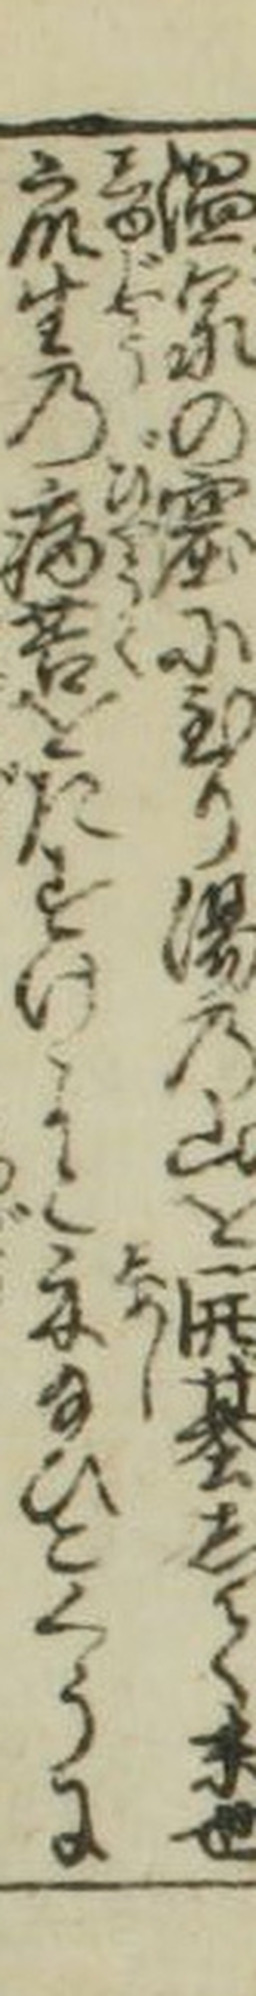衆生の病苦をたすけよと示給ひこくうに
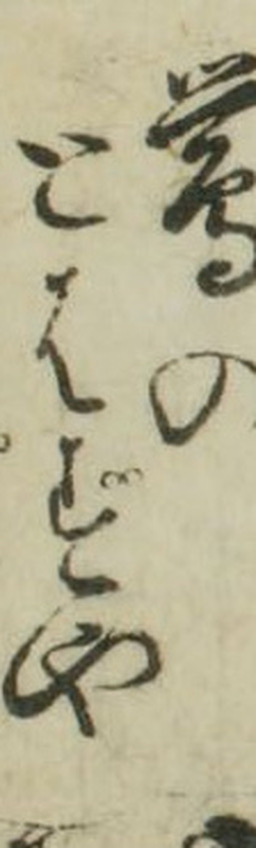とはずや
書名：女源氏教訓鑑
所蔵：東京学芸大学附属図書館
